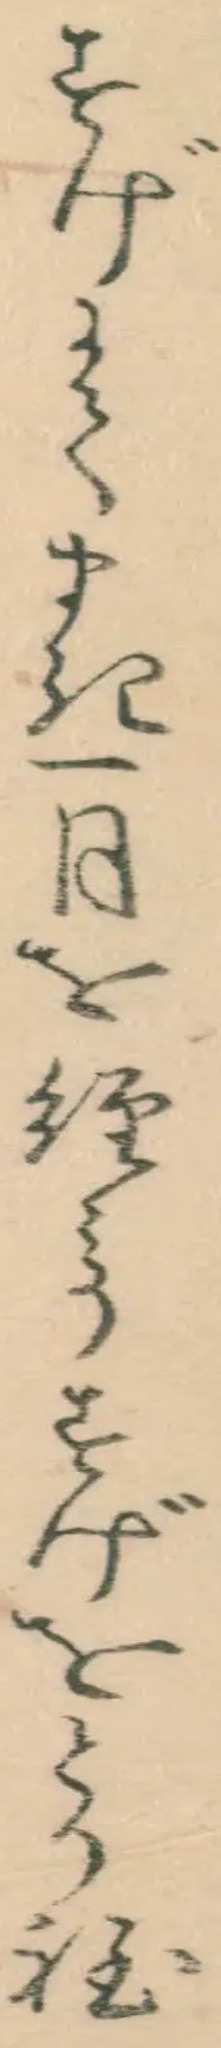すげにてまき一月を経ころすげをとり程
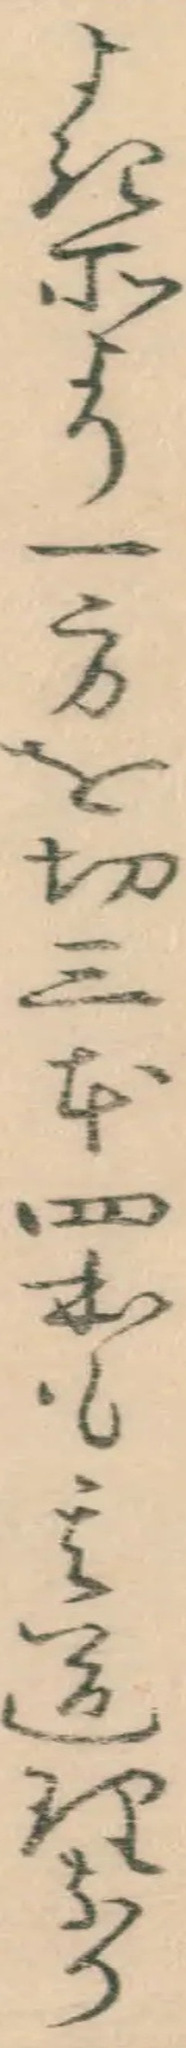よき所より一方を切三本四本も其道理なり
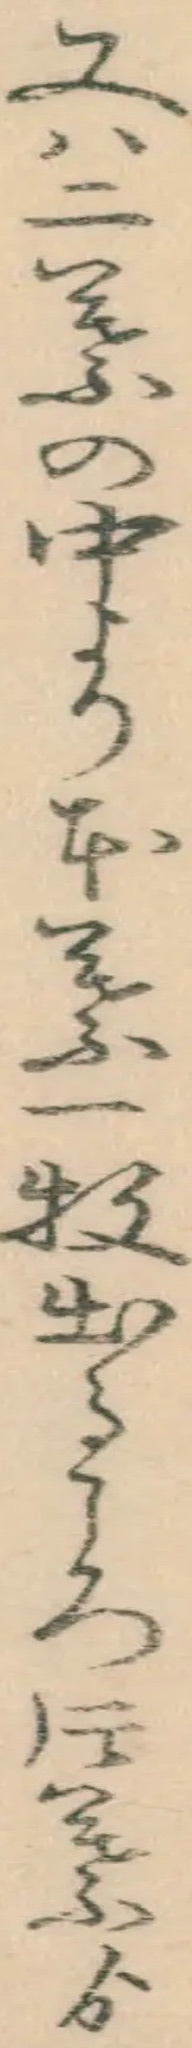又ハ二葉の中より本葉一枚出るころ片葉ゟ
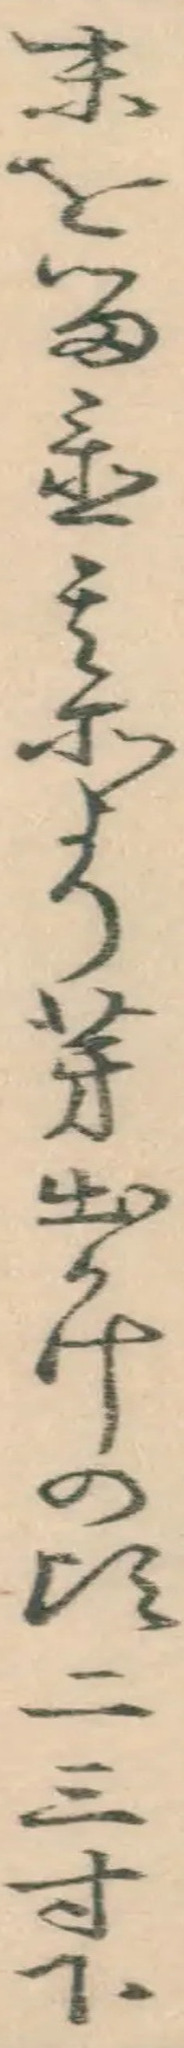末を留置其所より芽出かけの頃二三寸下
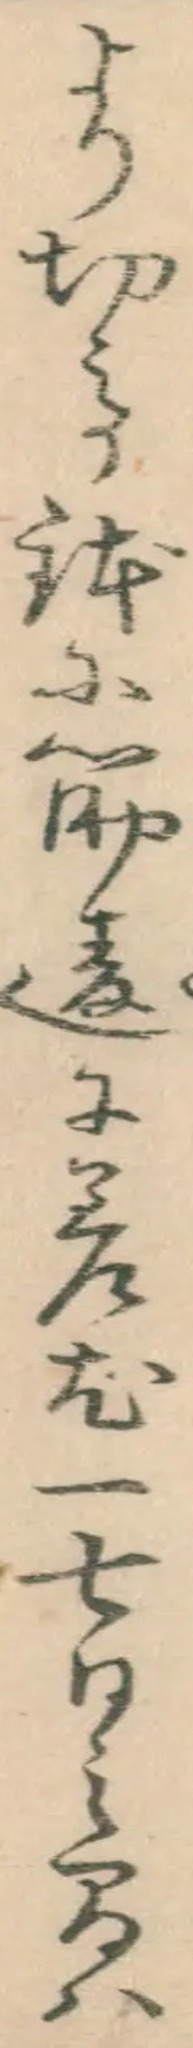より切て鉢に筋違に差尤一七日の間ハ
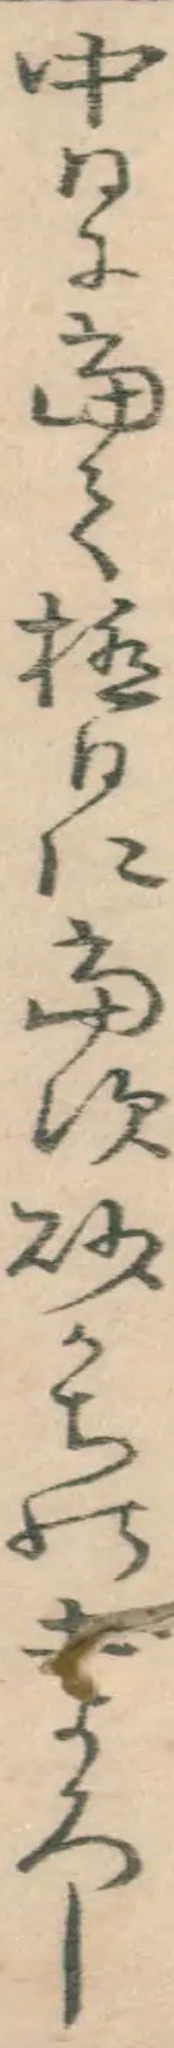中日に当て極日に当ず砂かちの土よろし

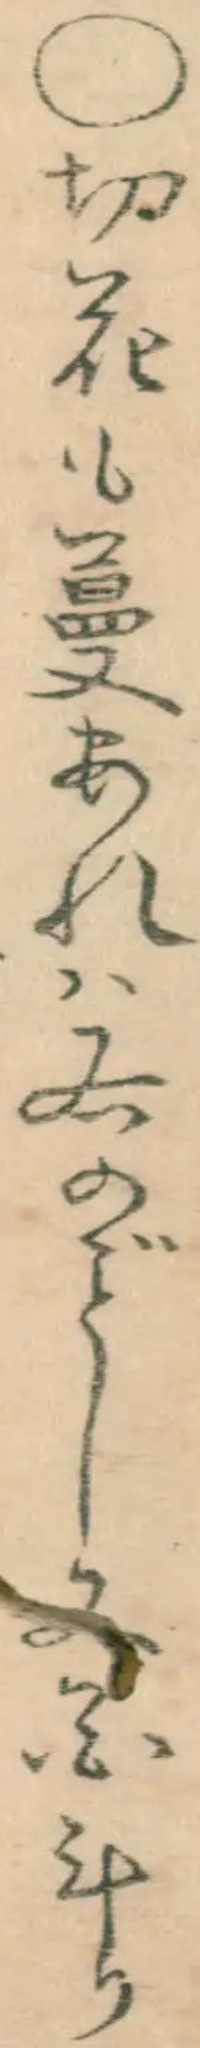〇切花も蔓あれハ右のごとし又花計り
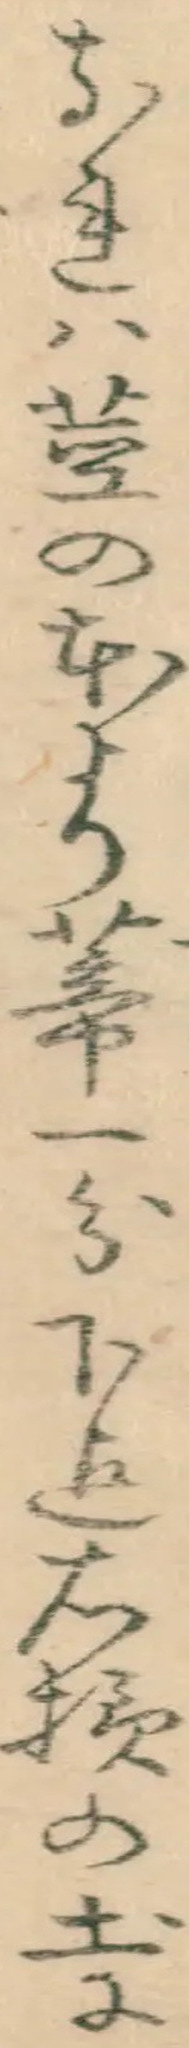なれハ茎の本より蔕一分下迄右様の土に
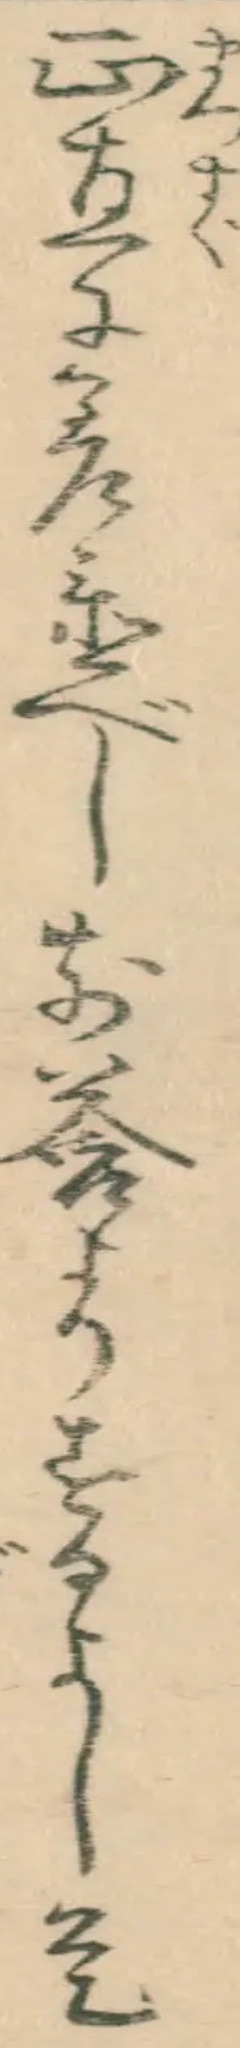正直に差置べし前よりするよし是
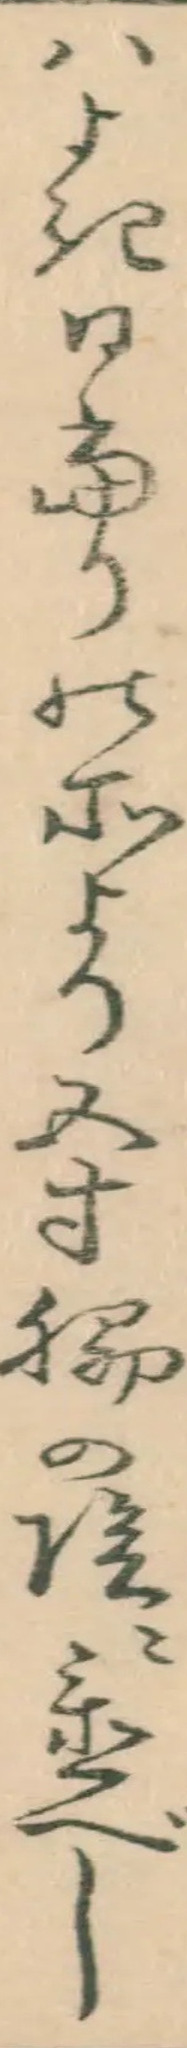ハよき日当りの所より五寸脇の陰ニ置べし
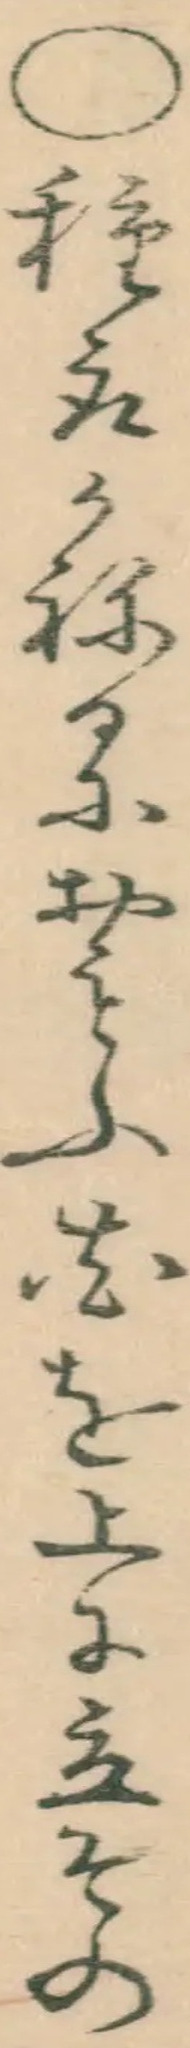〇種取かねるにおもふ花を上に立その
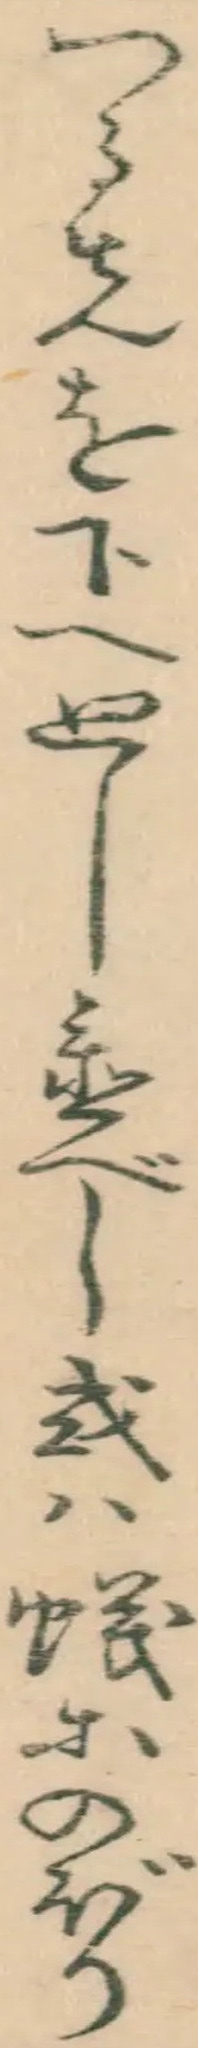つる先を下へとし置べし或ハあり蟻等のぼり
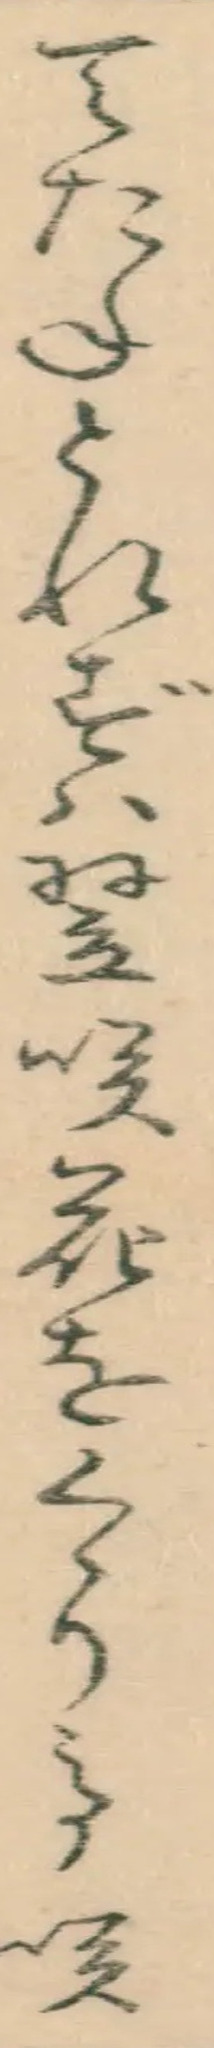てたねとれずハ翌咲花をくゝりて咲
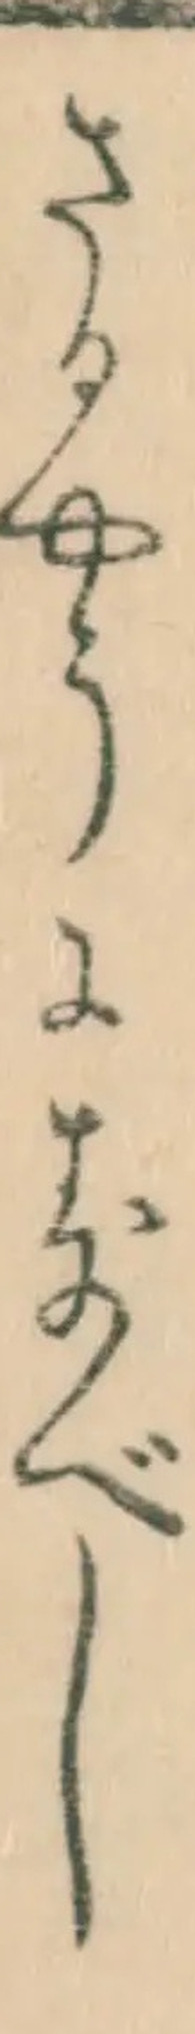たるやうにすべし
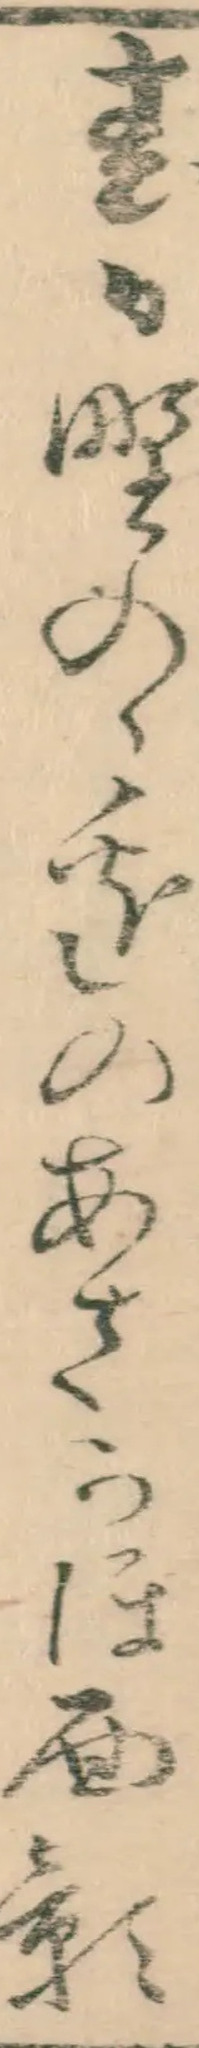春日野のゝ辺のあさかほ面影
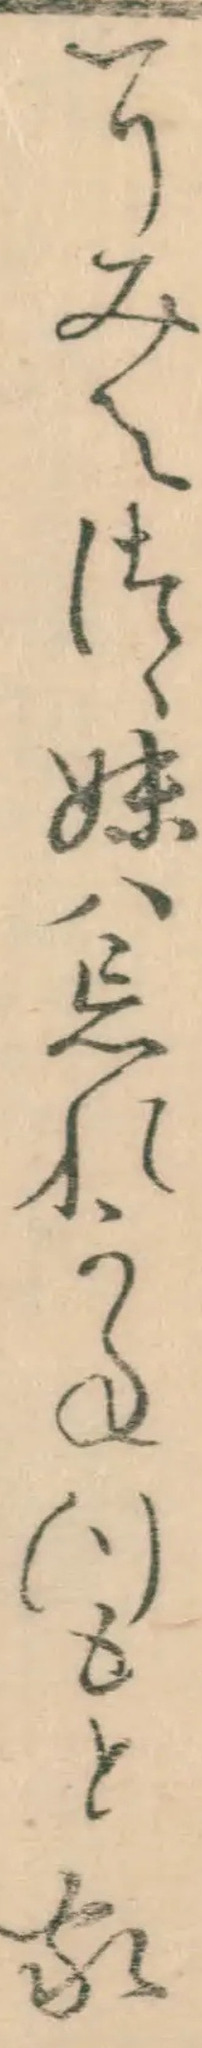にみえつゝ妹ハ忘れかねつもと家
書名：花壇朝顔通 2巻. [2]
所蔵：国立国会図書館 National Diet Library, JAPAN
